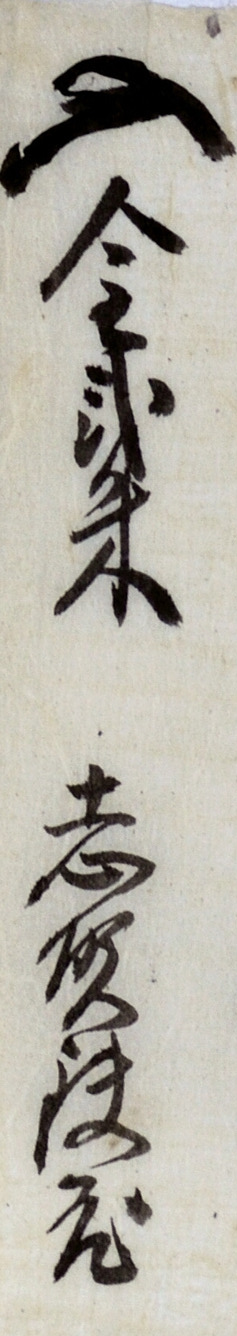〆金弐米志賀鉄蔵
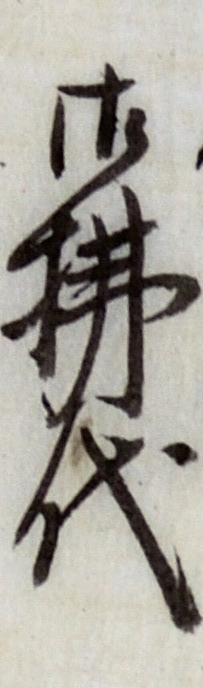御払代

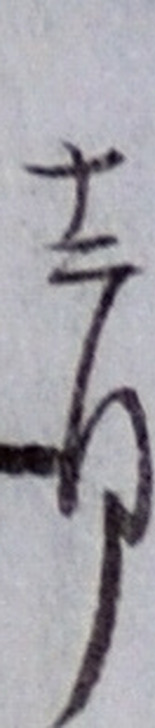十二月
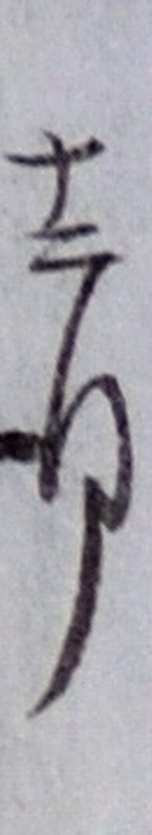十二月
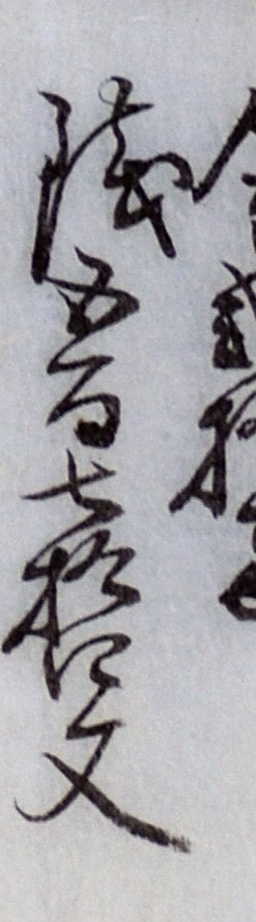銭六百七拾弐文
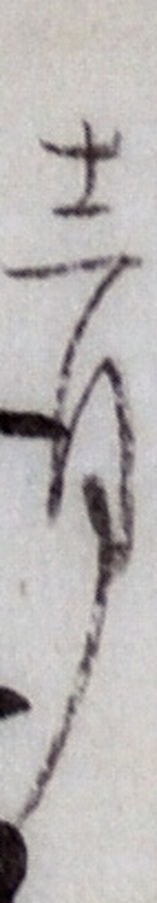十二月
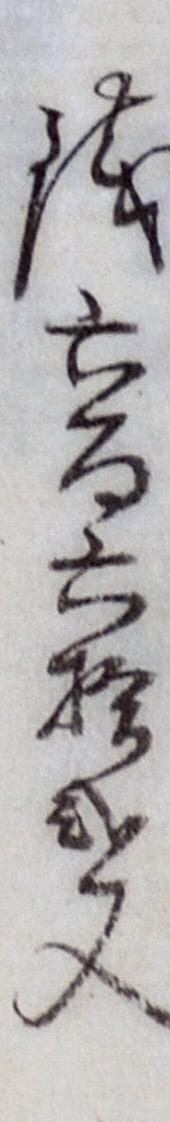銭六百七拾弐文
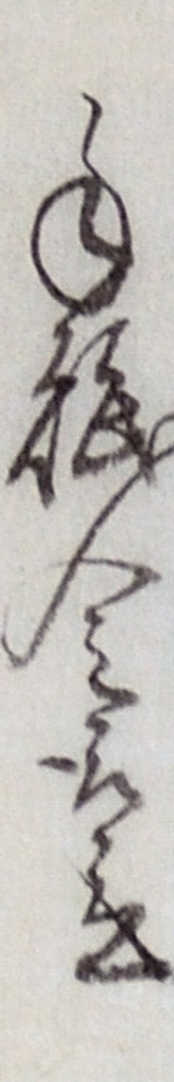年賦金取置
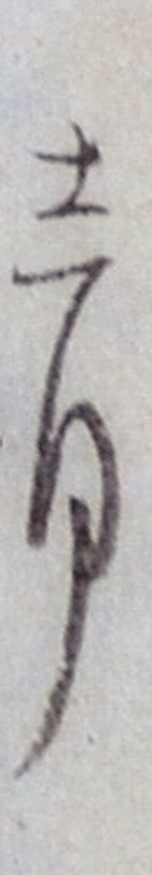十二月
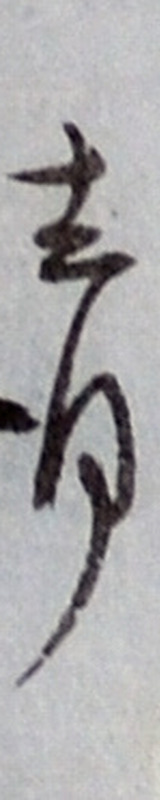十二月
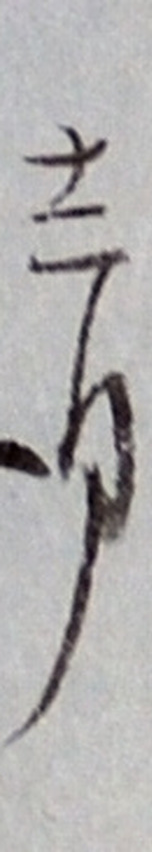十二月
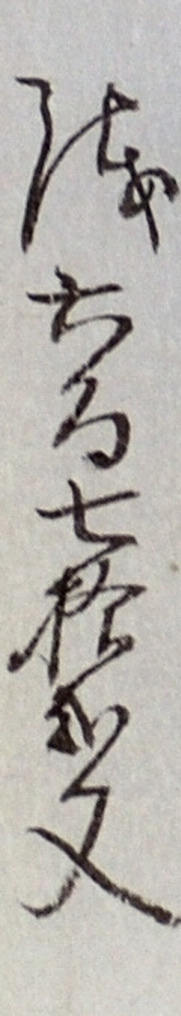銭六百七拾弐文
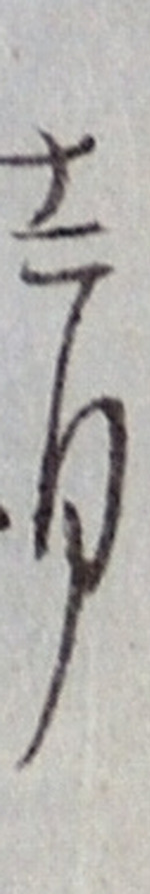十二月
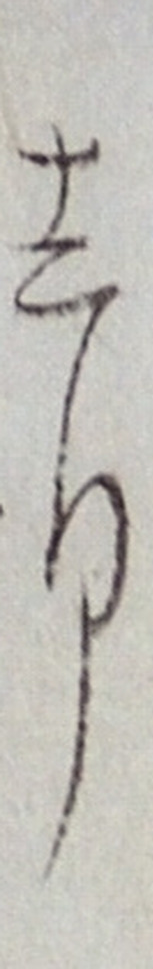十二月
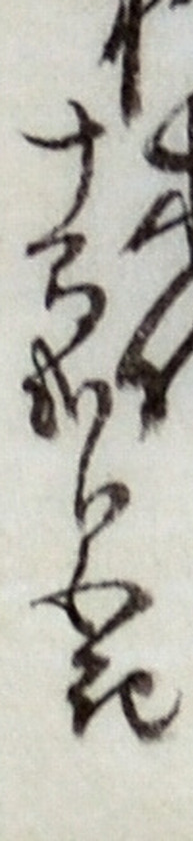十間弐分五厘

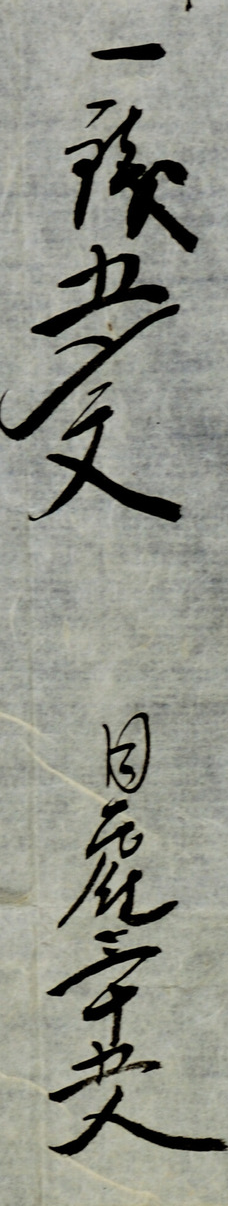一銭五貫文日雇三十五人
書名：御山方御拂物代料取立帳
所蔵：伊那市立高遠町図書館・合同会社AMANE
